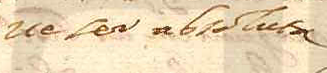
ue ser absoluta
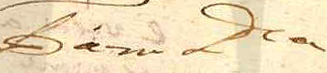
Fam Pca
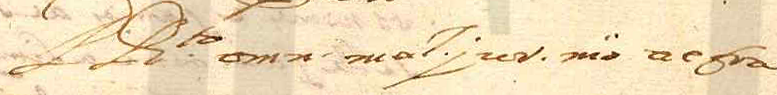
P R.to omn. mel. jur. mö ac fra
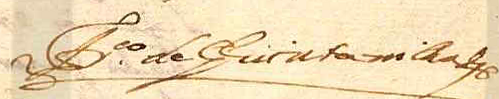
Fr.co de Quintanilha
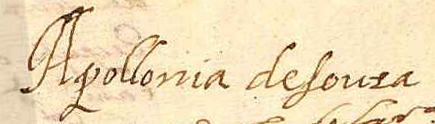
Apollonia de souza
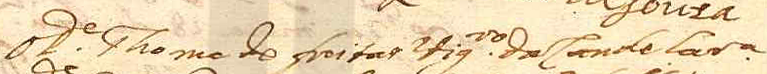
o P.e Thome de freitas Vigro. da Candelar.a
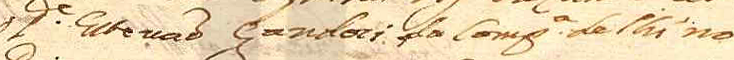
o P.e Esteuão Gandozi da Compa de lhs̄ no
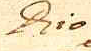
Rio
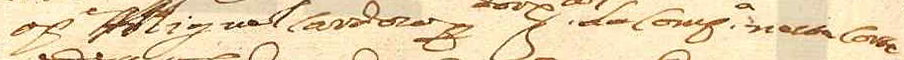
o pe Miguel Cardozo p.dor g.al da Comp.a nesta corte
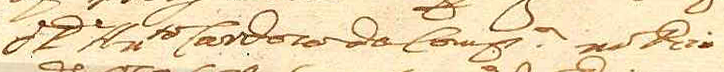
o Pe Anto Cardozo da Comp.a no Rio
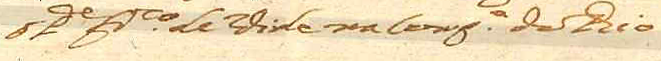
o Pe fr.co de Vide na Comp.a do Rio
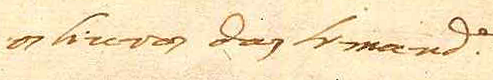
os liuros das Irmand.es
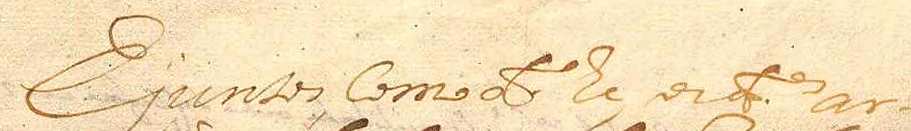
E juntos, como d̄o he, os d̄.os ar
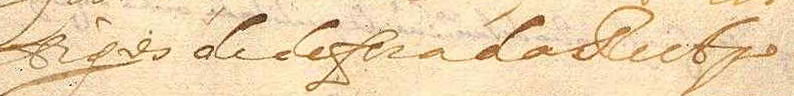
tigos de defeza da Re Apo
